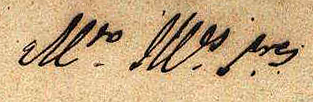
M.to Ill.es s.res
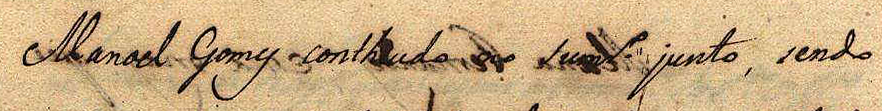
Manoel Gomes conth_udo no sumr.o junto, sendo
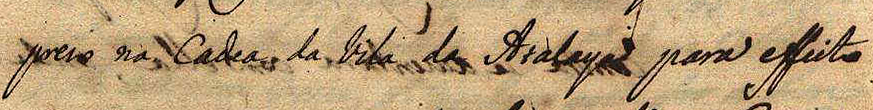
preso na Cadea da Vila da Atalaya para effeito
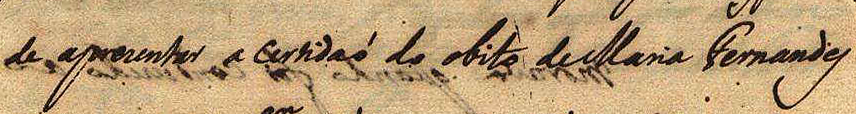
de aprezentar a certidaõ do obito de Maria Fernandes
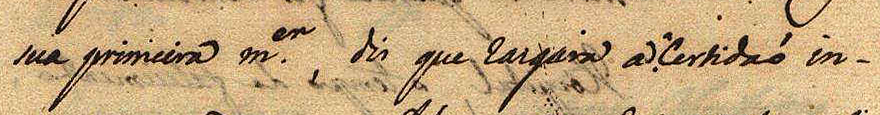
sua primeira m.er, dis que Rasgara a certidaõ in
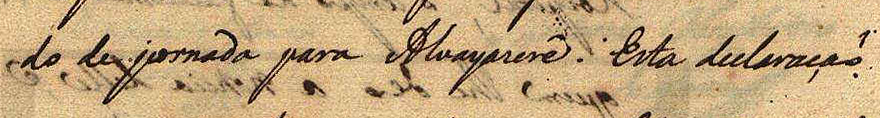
do de jornada para Alvayazere: Esta declaraçaõ.
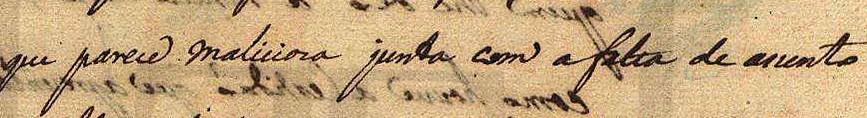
que pareçe malicioza junta com a falta de assento
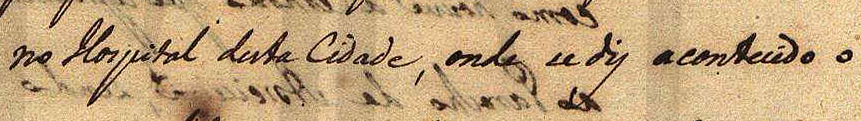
no Hospital desta Cidade, onde se dis acontecido o
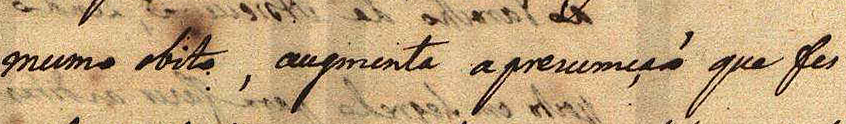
mesmo obito, augmenta a prezumçaõ que fes
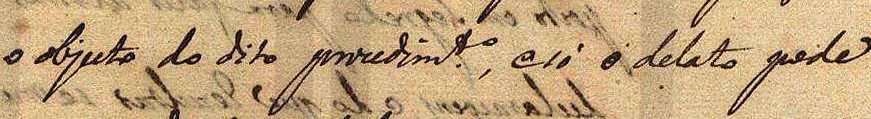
o objeto do dito procedim.to, e só o delato pode
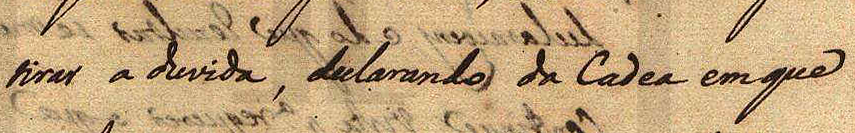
tirar a duvida, declarando da Cadea em que
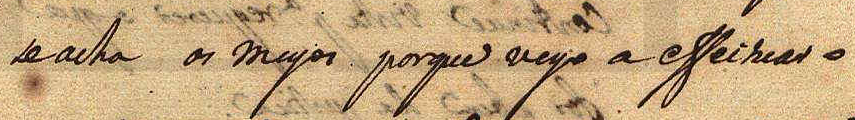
se acha os meyos porque veyo a effeituar o
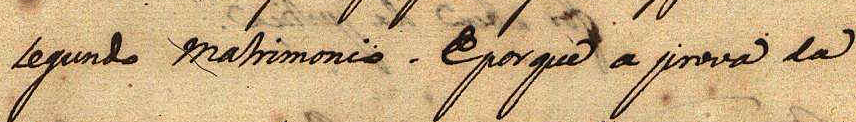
segundo matrimonio. E porque a prova da
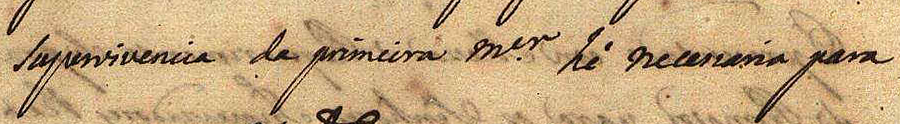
superviuencia da primeira m.er hé necessaria para
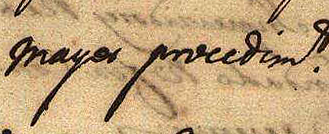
mayor procedim.to
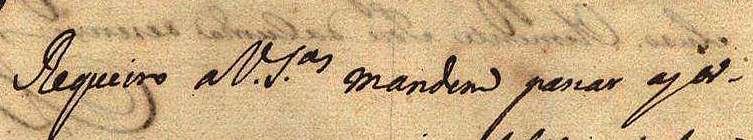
Requeiro a V. S.as mandem passar as or
